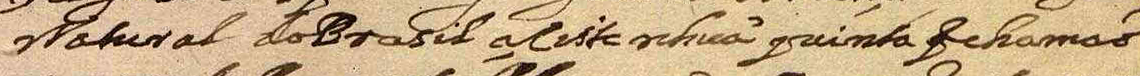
natural do Brasil aciste nhuā quinta q̄ chamaõ
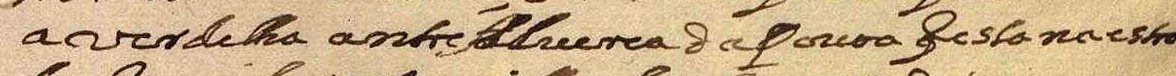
a verdelha antre Aluerca da Pouoa q̄ esta na estra
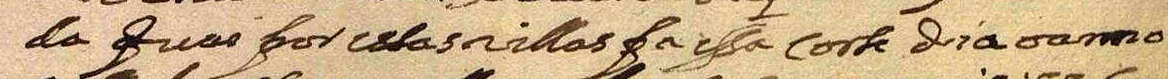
da q̄ uai por estas villas pa essa corte de ia o anno
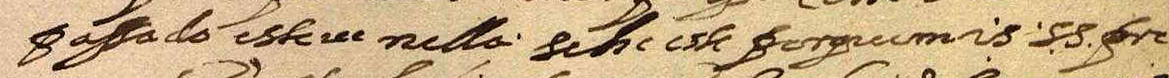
passado esteue nella; se he este por quem Vs SS. pre
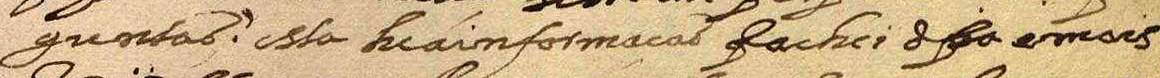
guntaõ. esta he a informaçaõ q̄ achei disso e mais
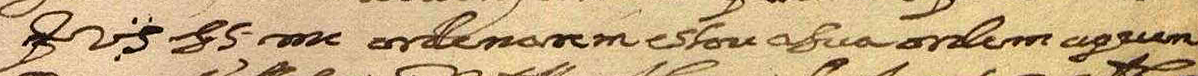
q̄ VS SS me ordenarem estou a sua ordem a quem
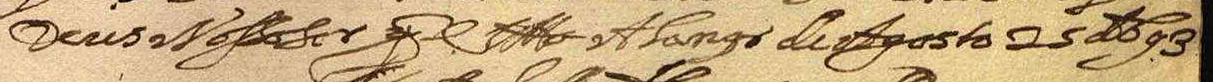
Deus Nosso sor ge ettta Alanqr de Agosto 25 d̄ 693
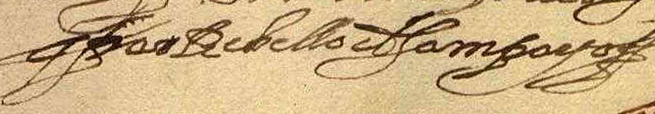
gpar Rebello d̄ Sampayo
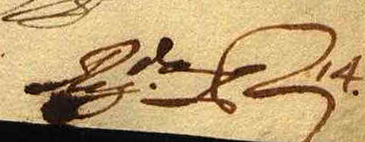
Reg.da fl14.
